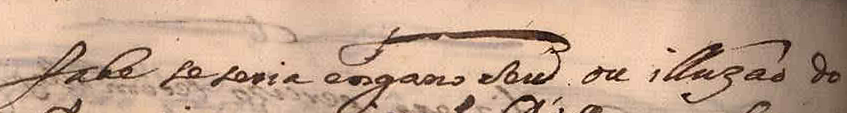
sabe se seria engano seu ou illuzaõ do
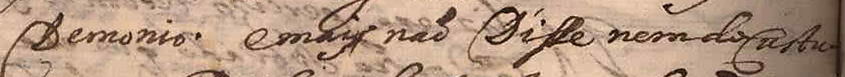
Demonio; e mais naõ Disse, nem do Custu
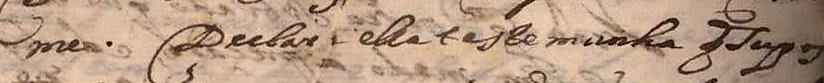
me. Declare ella testemunha q̄ supos
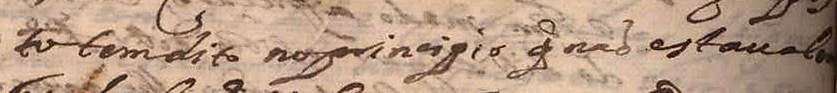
to tem dito no principio q̄ naõ estaua ale
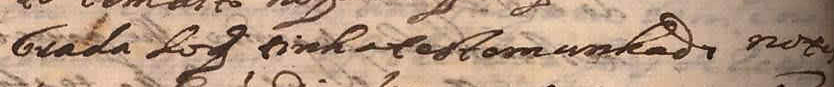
brada do q̄ tinha testemunhado no tes
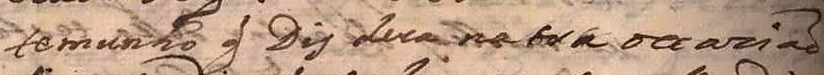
temunho q̄ Dis dera na tra occaziaõ
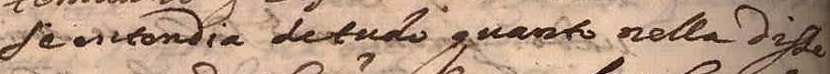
se entendia de tudo quanto nella disse
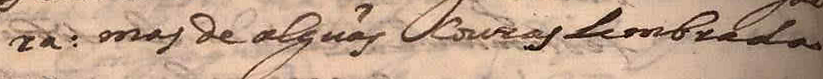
ra; mas de alguās couzas lembrada
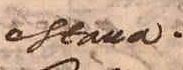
estaua.
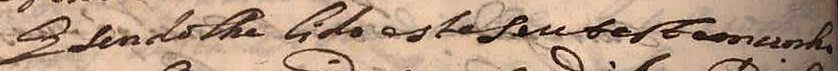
E sendolhe lido este seu testemunho
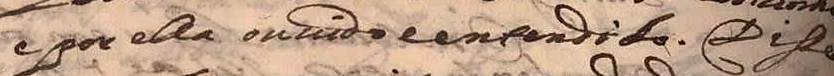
e por ella ouuido e entendido. Disse
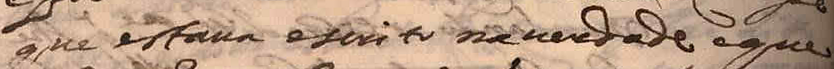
que estaua escrito na uerdade, e que
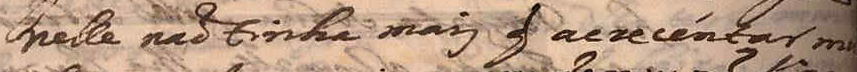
nelle naõ tinha mais q̄ acrecentar, mu
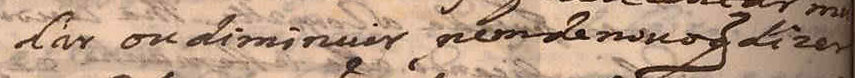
dar ou diminuir, nem de nouo q̄ dizer
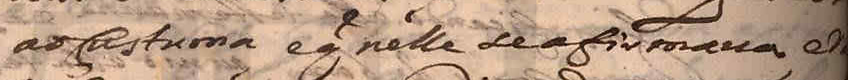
ao Custume, e q̄ nelle se afirmaua e ra
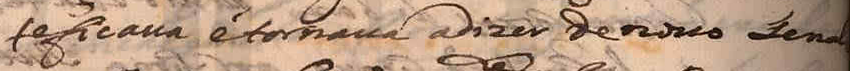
teficaua e tornaua a dizer de nouo sendo
